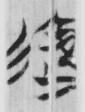御
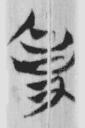事
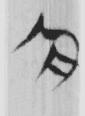今
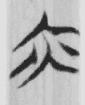亦
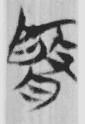{戶肉攴}
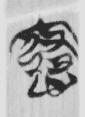{宀弘心}
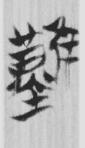難
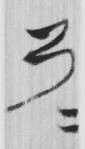乃
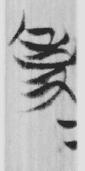事
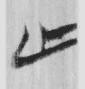亡
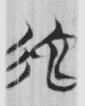{彳它}
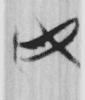女
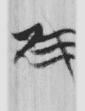隹
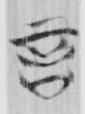言
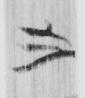之
